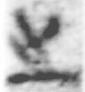之
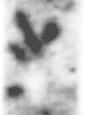之
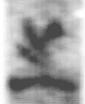之
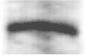一
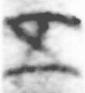之
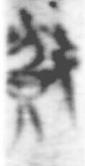○（紛）
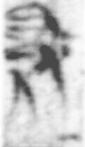敗
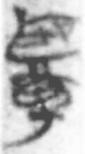○（緅）
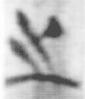之
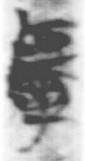○（緅）
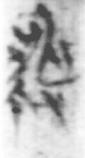紳（靷）
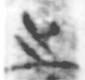之
